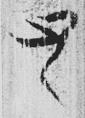又
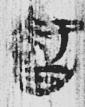智（智）
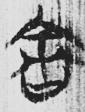○（舍）
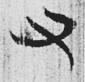又（有）
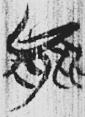能
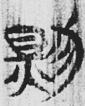則
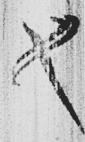民
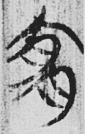宜
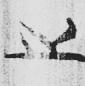之
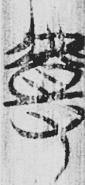○（且）
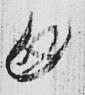臣
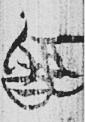聞
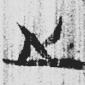之
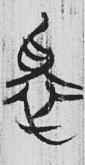卒B
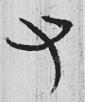又（有）
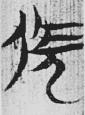倀（長）
